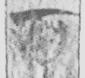百
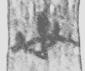卅
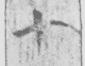七
